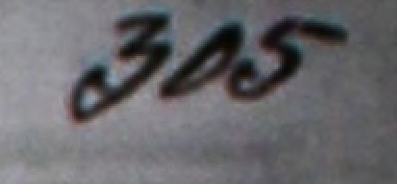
305
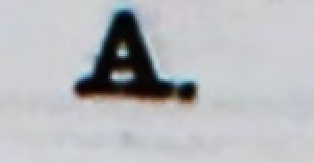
A.
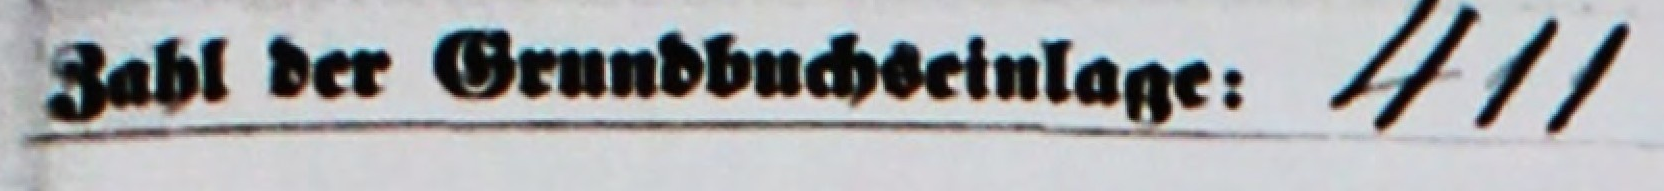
Zahl der Grundbuchseinlage: 411
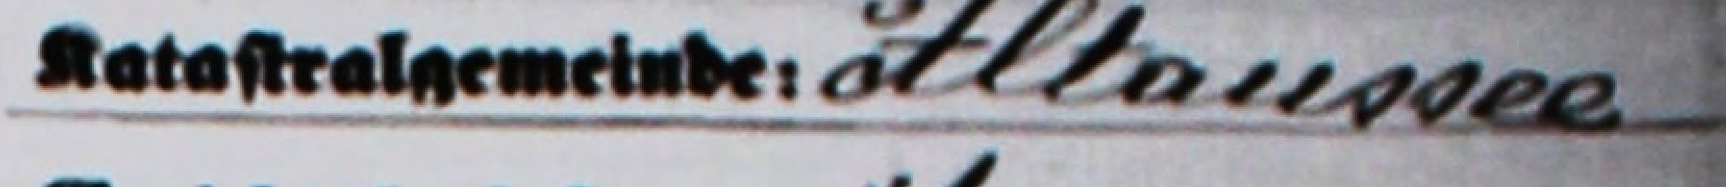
Katastralgemeinde: Altaussee
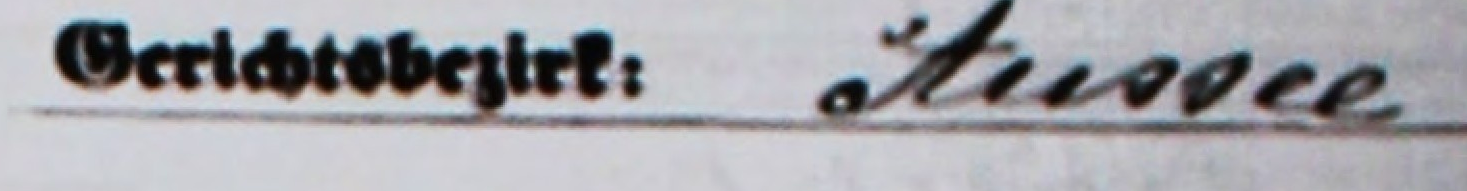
Gerichtsbezirk: Aussee
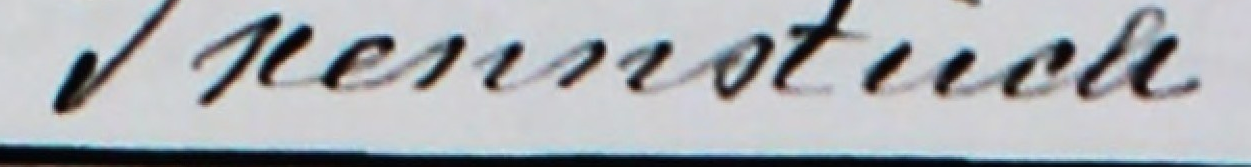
Trennstück
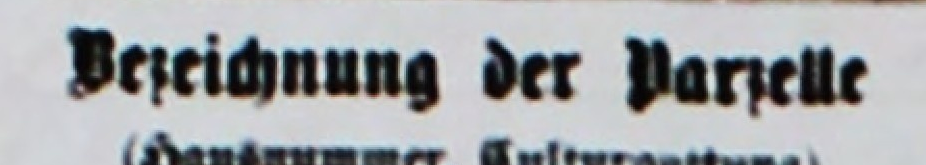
Bezeichnung der Parzelle
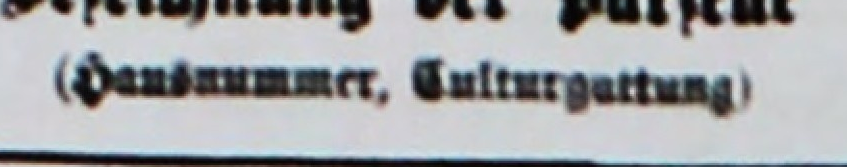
(Hausnummer, Culturgattung)
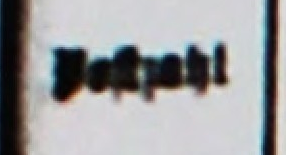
Postzahl
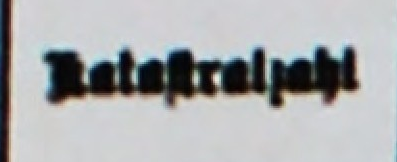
Katastralzahl
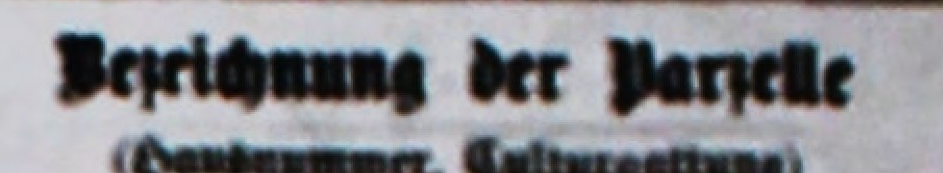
Bezeichnung der Parzelle
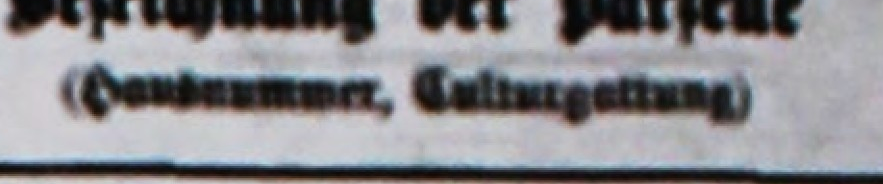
(Hausnummer, Culturgattung)
